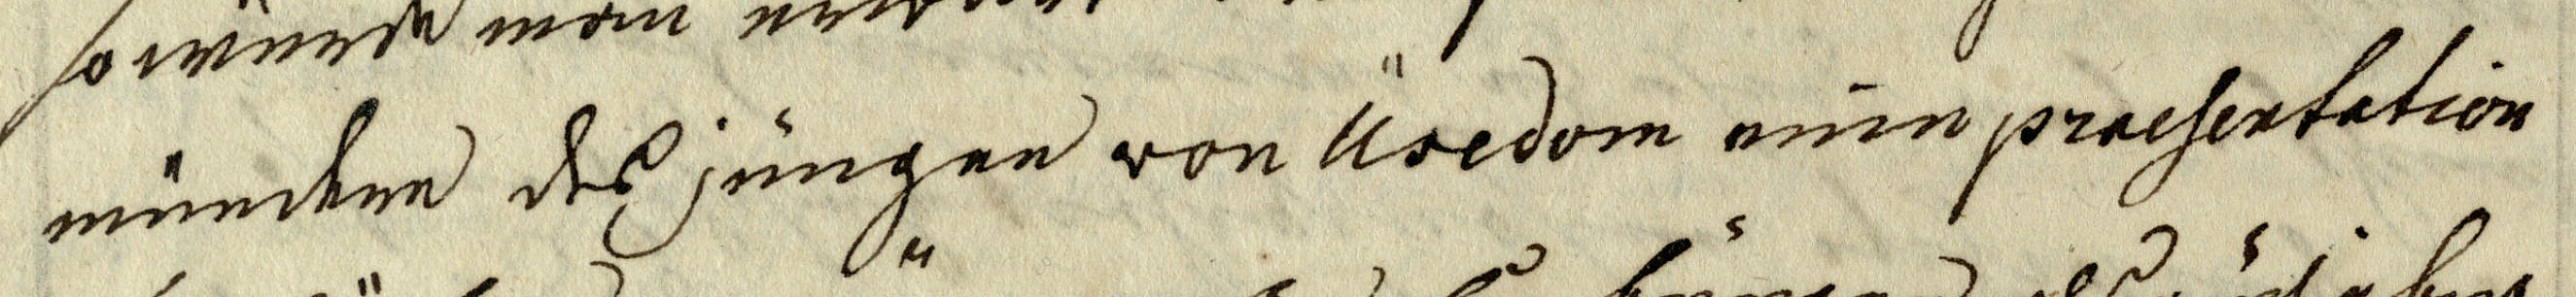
mündern des jungen von Usedom eine praesentation
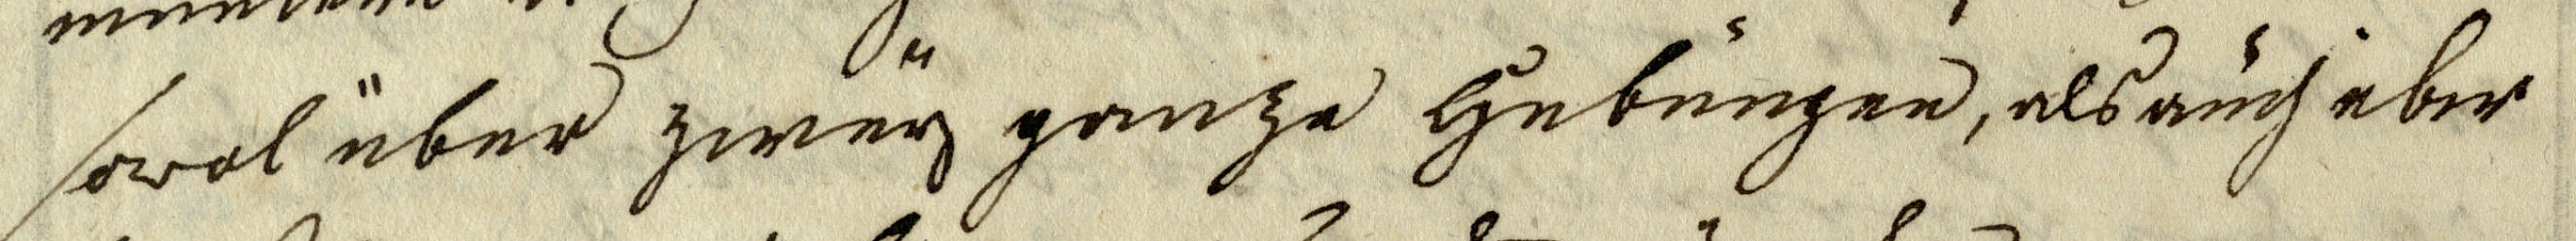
sowol über zweÿ ganze Hebungen, als auch über
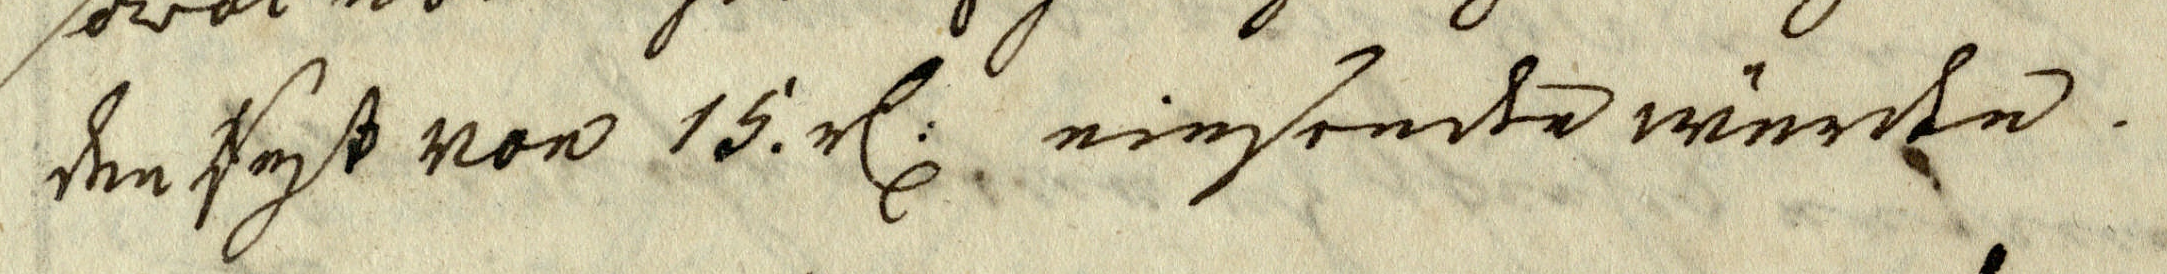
den Rest von 15. r. einsenden würden.
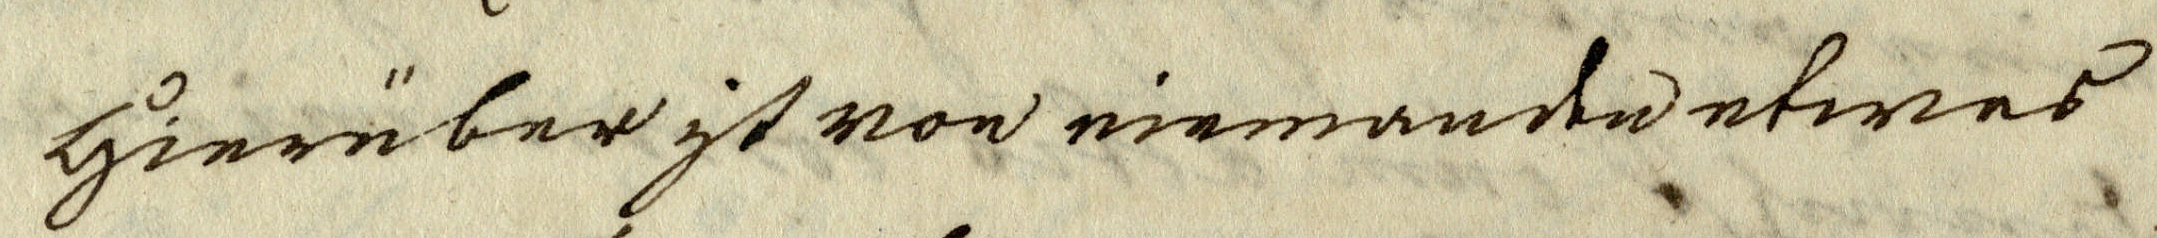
Hierüber ist von niemanden etwas
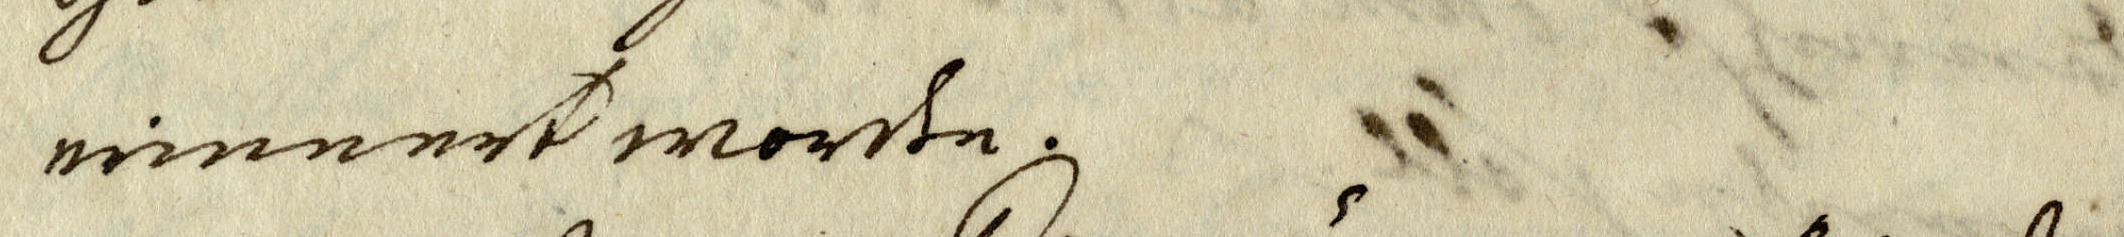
erinnert worden.
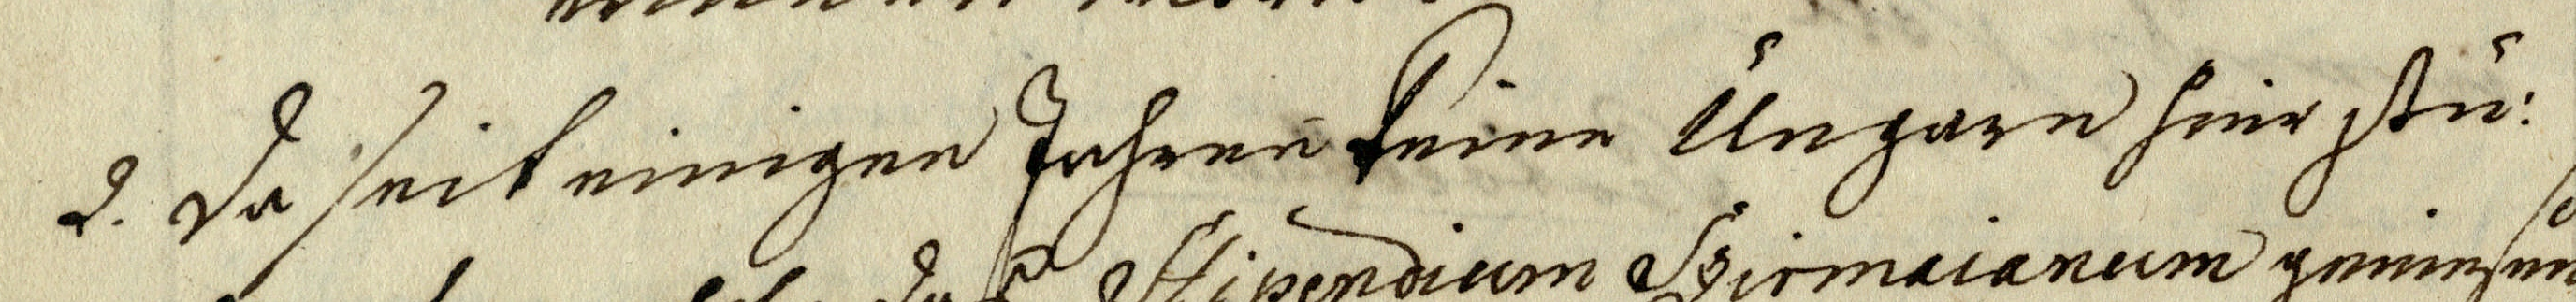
2. Da seit einigen Jahren keine Ungarn hier stu¬
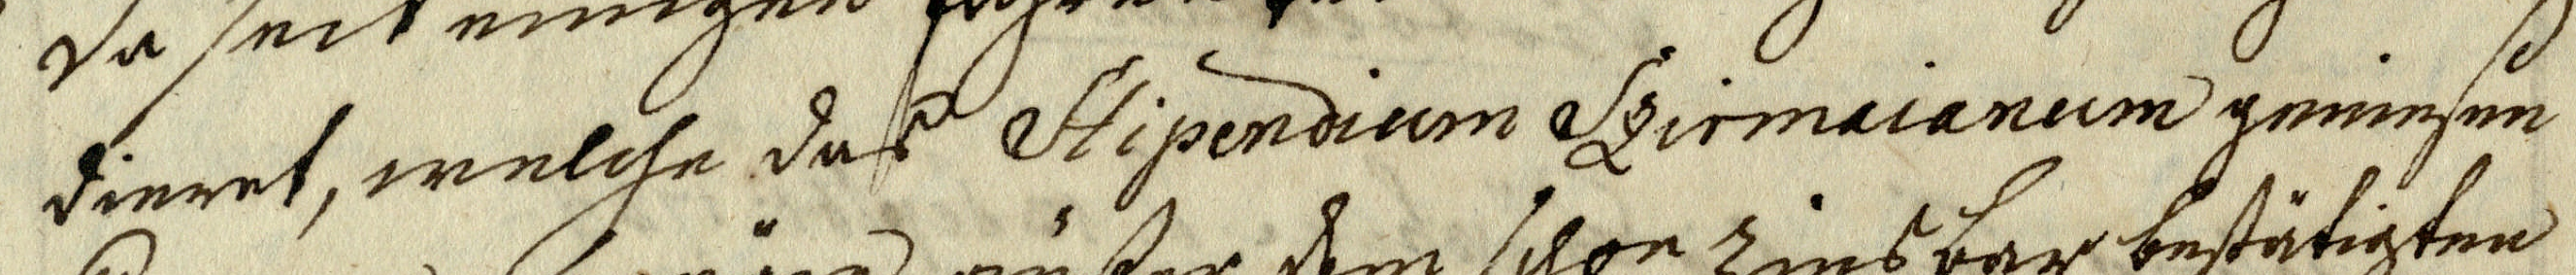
diret, welche das Stipendium Szirmaianum geniesen
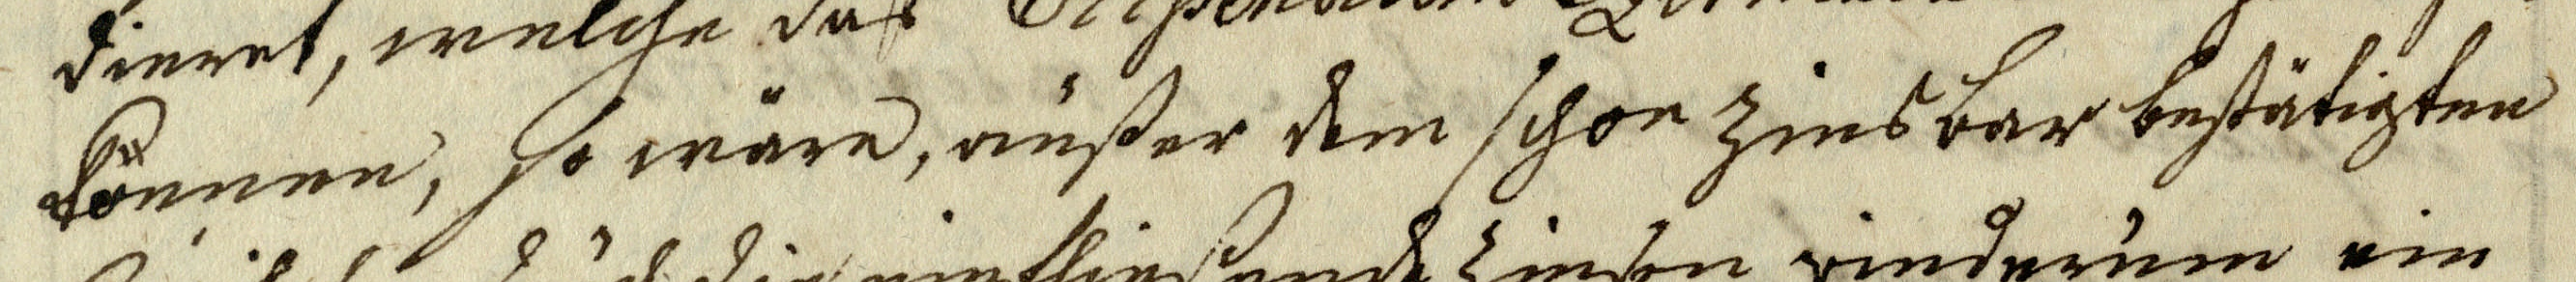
können, so wäre, außer dem schon zinsbar bestätigten
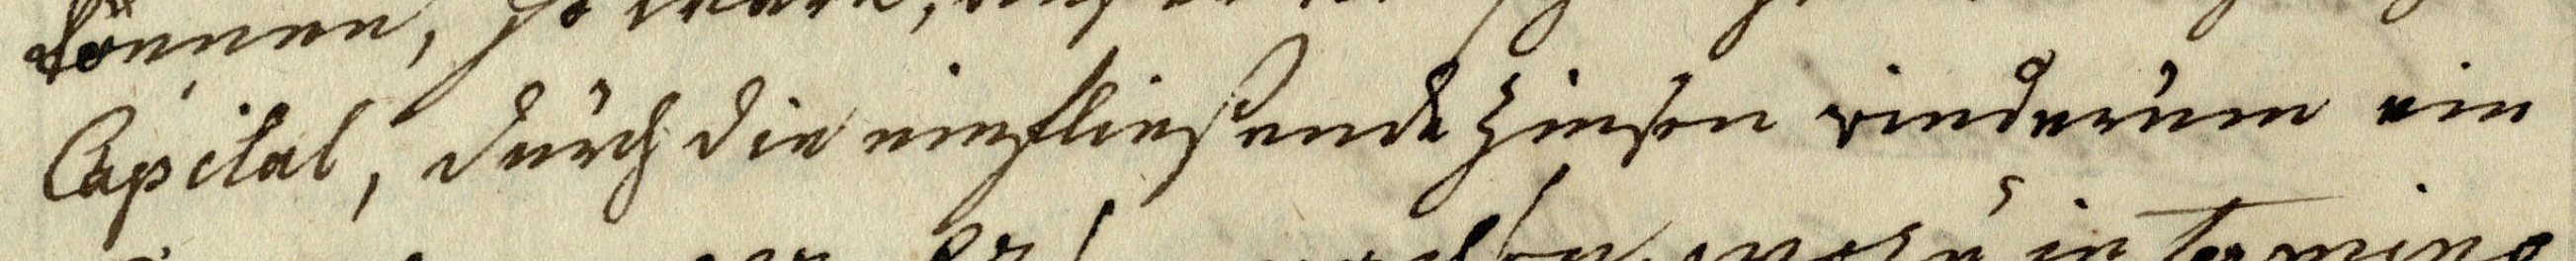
Capital, durch die einfließende Zinsen wiederum ein
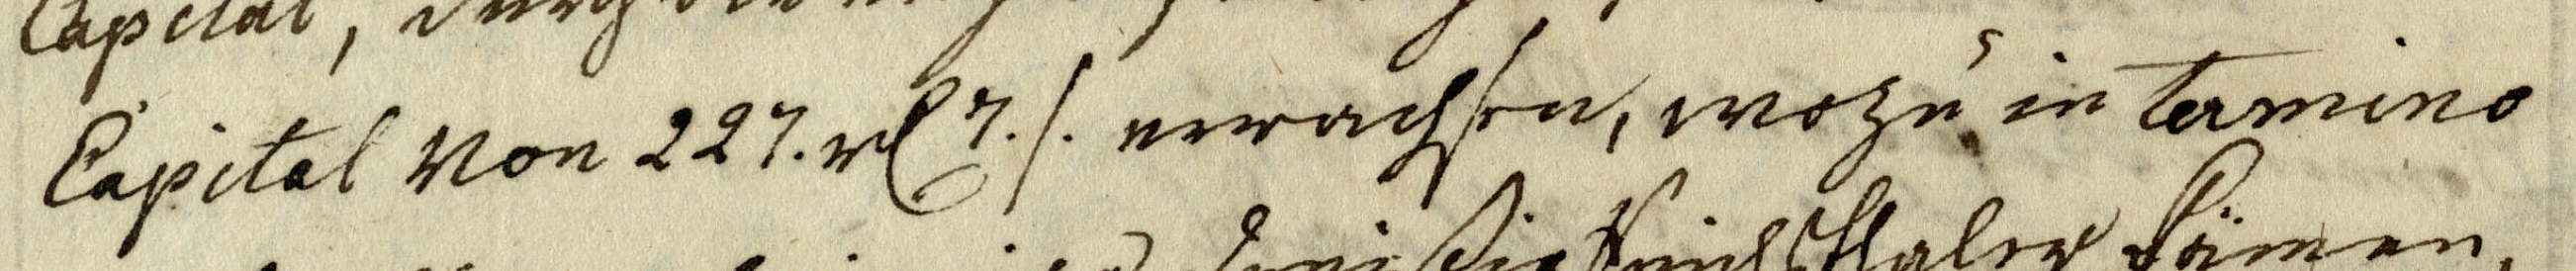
Capital von 227. r. 7. s. erwachsen, wozu in termino
